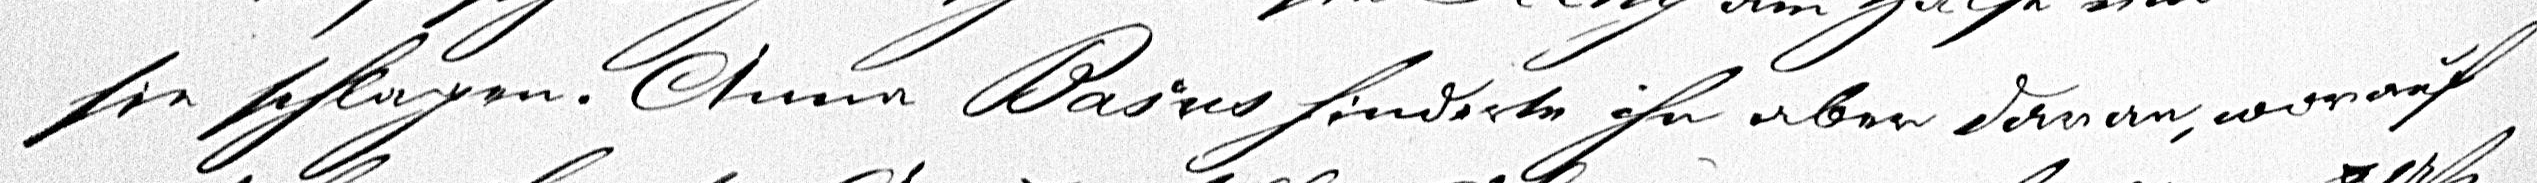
sie schlagen. Anna Basus hinderte ihr aber daran, worauf
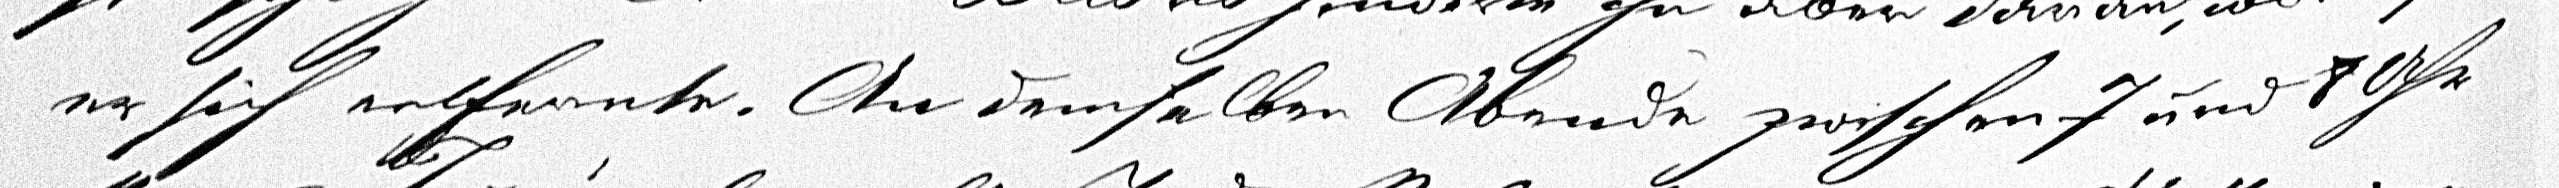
er sich entfernte. An demselben Abende zwischen 7 und 8 Uhr
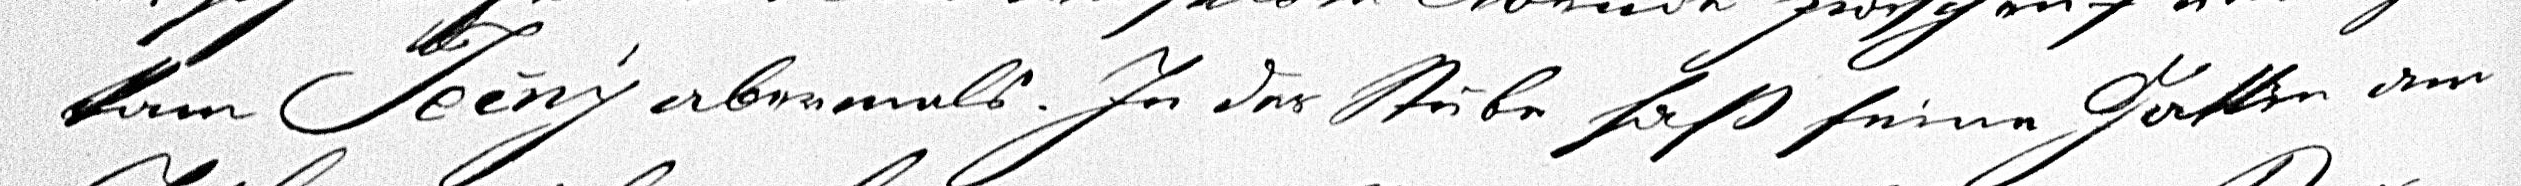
kam Jecný abermals. In das Stube haß seine Gattin am
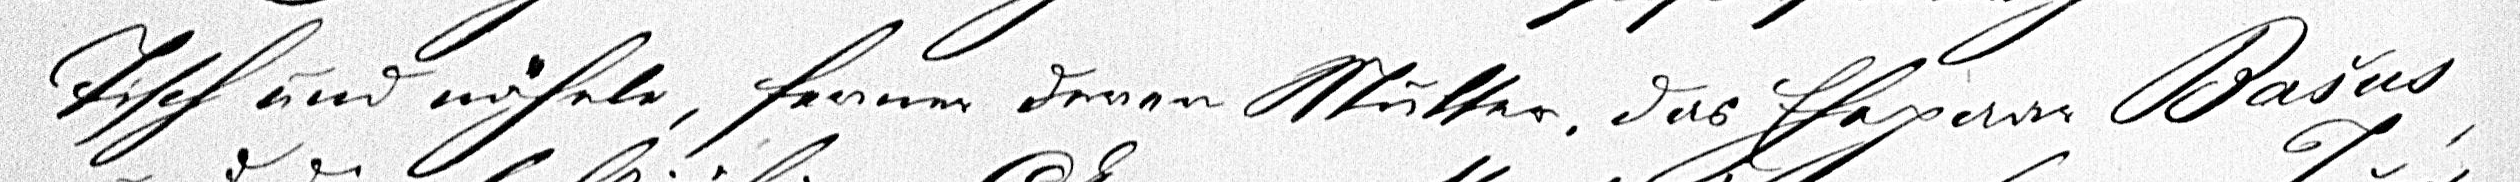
Tisch und nöhete, franer deren Mutter. Das Ehepaar Basus
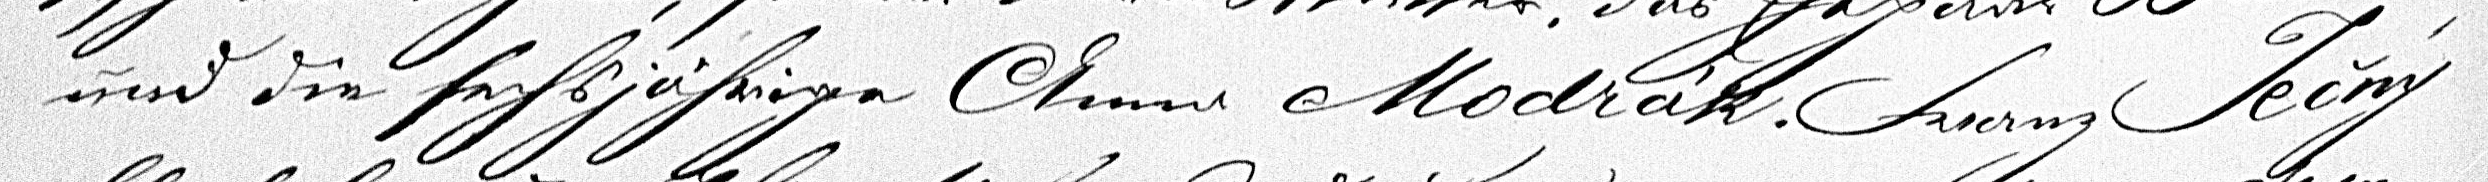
und die sechsjährige Anna Modrák. Franz Jecný
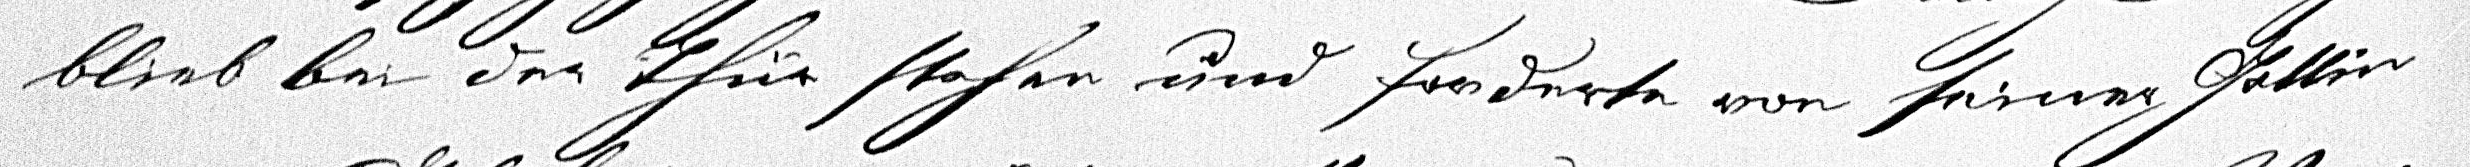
blieb bei der Thür Stefan und fraderte von seiner Gattin
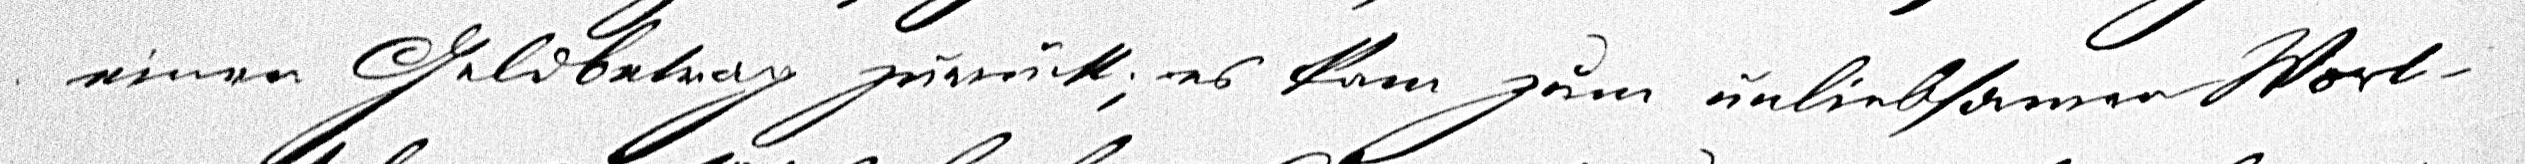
einer Geldbetrag zurück, es kam zum unliebsamer Wort¬
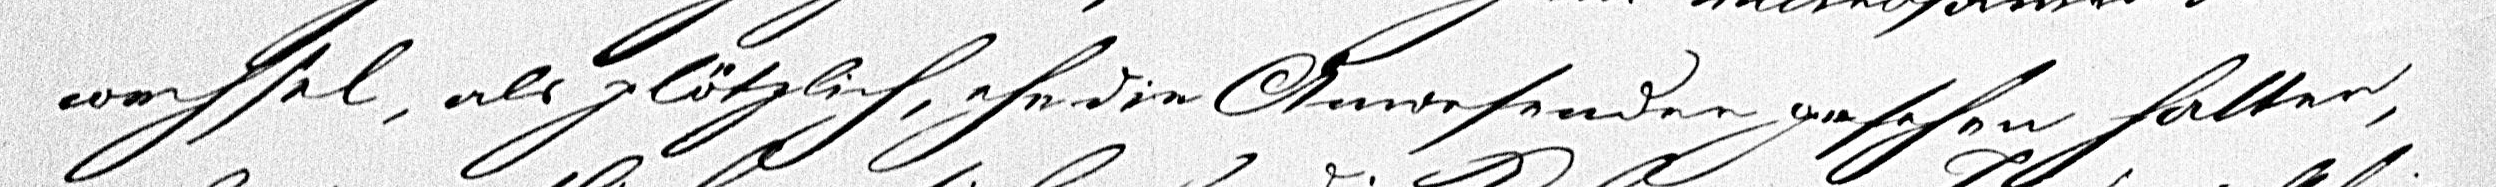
wechsel, als plötzlich, ehr die Anwesenden gesehen halten,
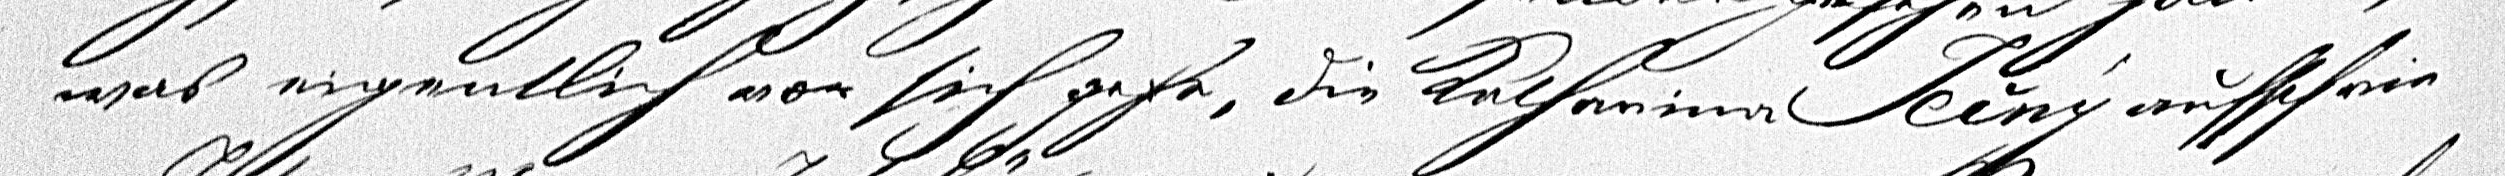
was eigentlich vor sich gehe, die Katharina Jecný ausschrie
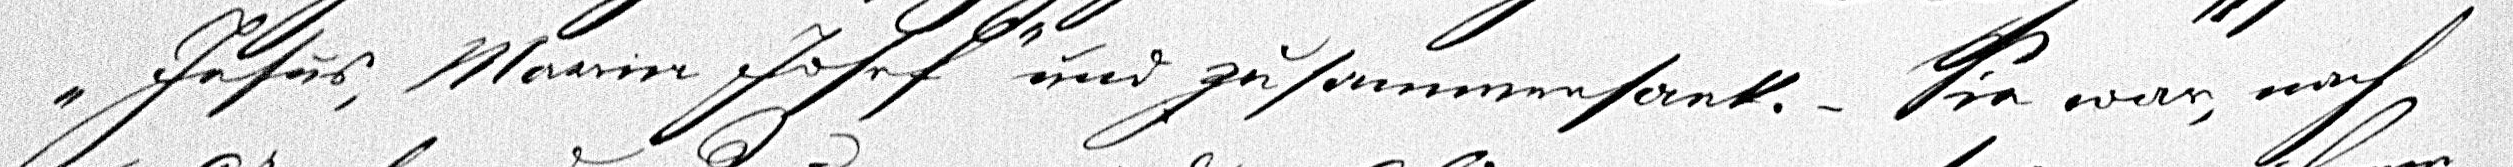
„ „Jesus, Maria Josef" und zusammensank. - Sie war, nach
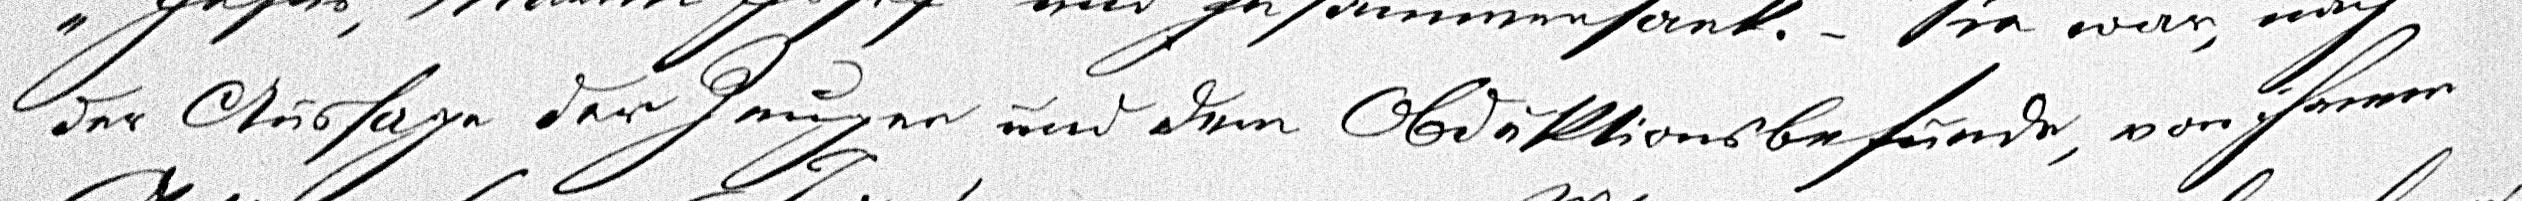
der Aussage der Junger und dem Obdektionsbefunde, von ihrem
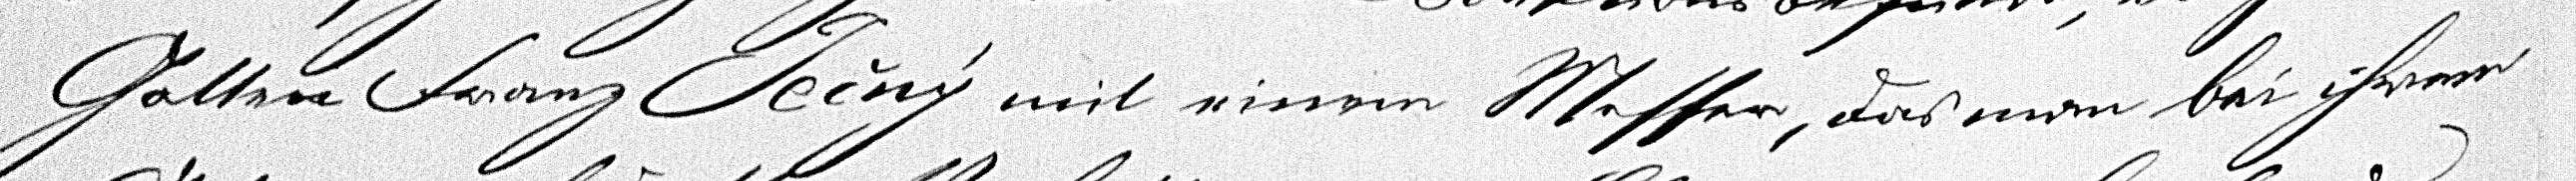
Gotter Franz Jecný mit einem Messer, das man bei ihrer
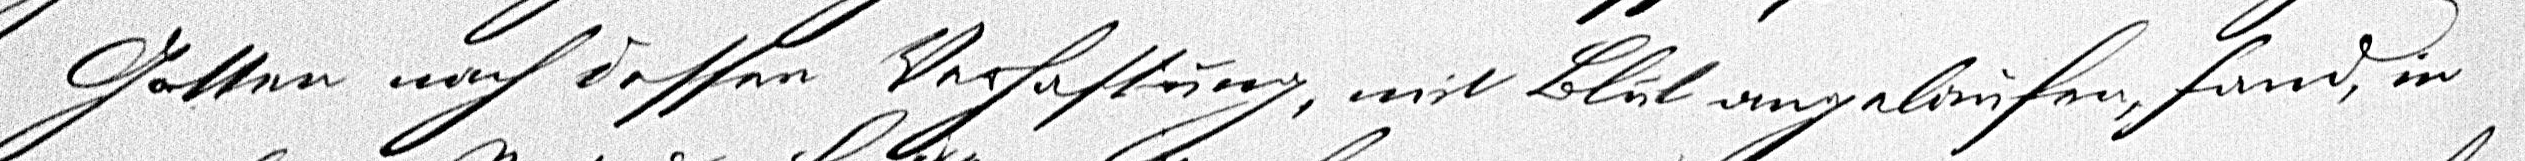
Gossen nach dessen Verhaftung, mit Blut angelaufen, fand, in
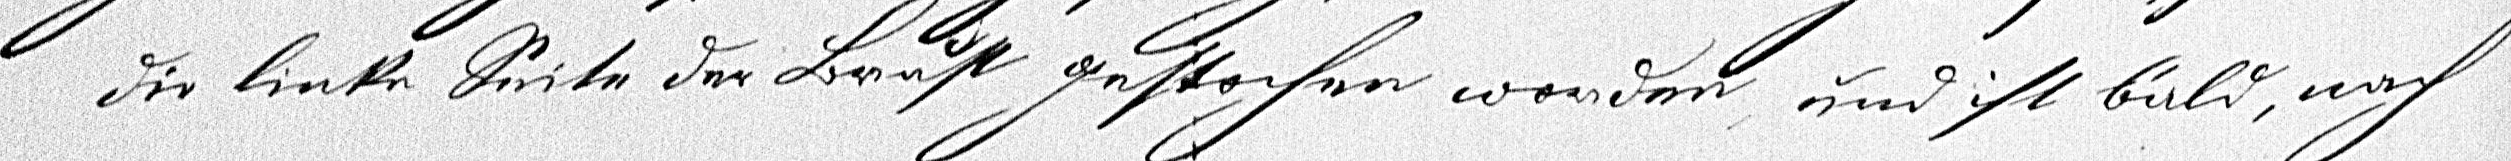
die linke Seite der Brust gestochen worden, und ist bald, nach
